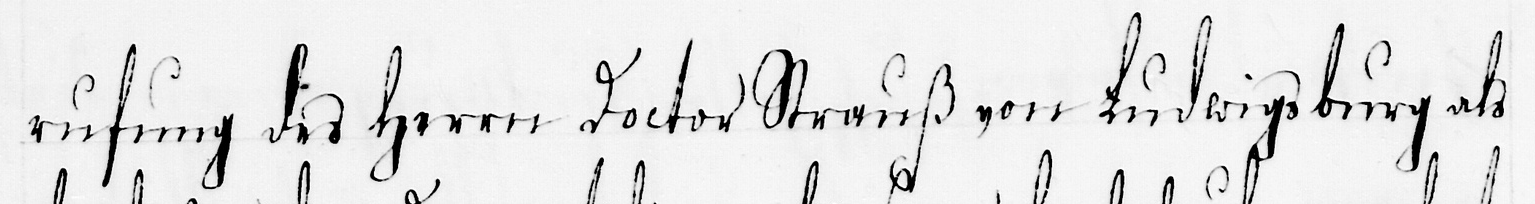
rufung des Herrn Doctor Strauß von Ludwigsburg als
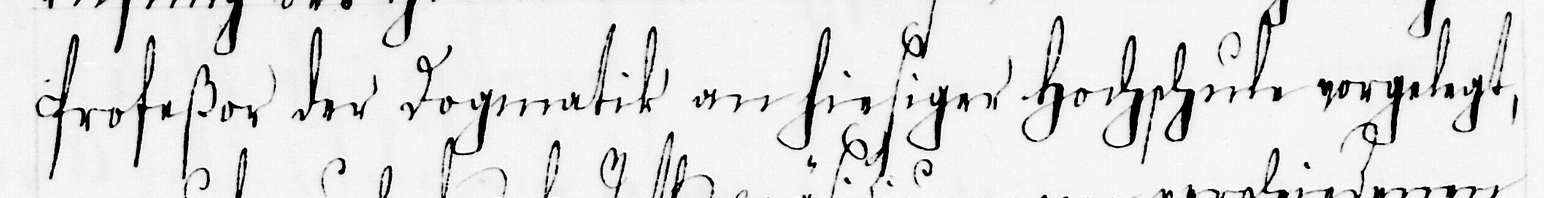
Profeßor der Dogmatik an hiesiger Hochschule vorgelegt,
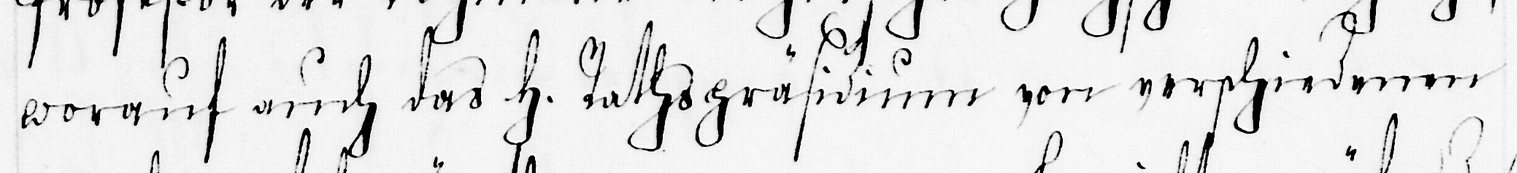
worauf auch das H. Rathspräsidium von verschiedenen
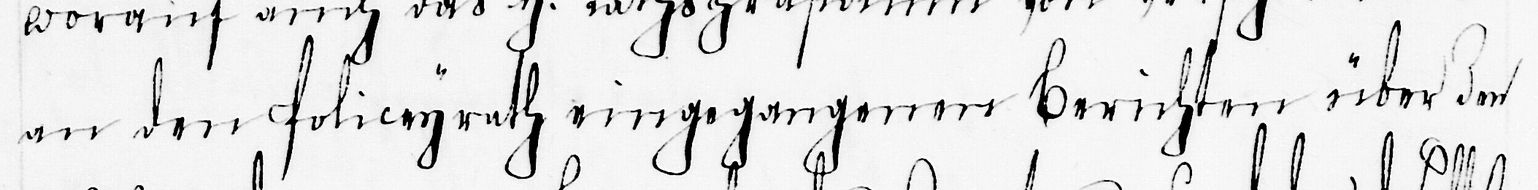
an den Policeyrath eingegangenen Berichten über den
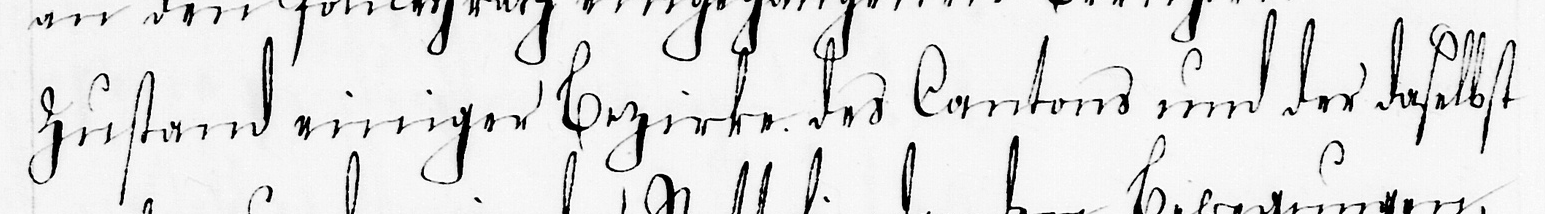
Zustand einiger Bezirke des Cantons und der daselbst
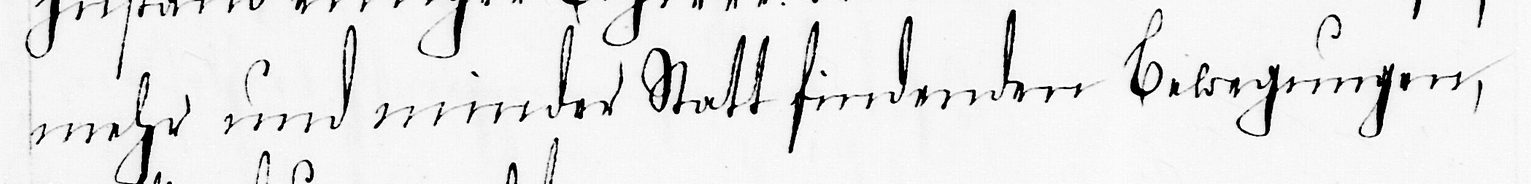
mehr und minder Statt findenden Bewegungen,
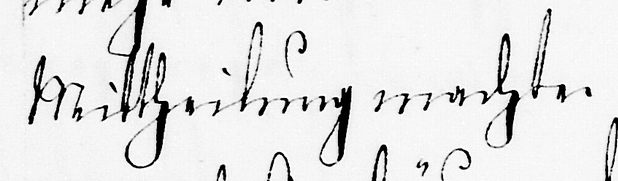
Mittheilung machte.
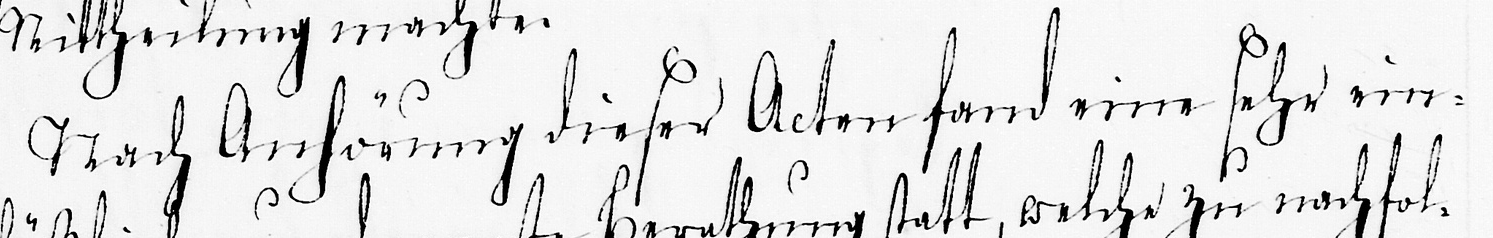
Nach Anhörung dieser Acten fand eine sehr ein¬
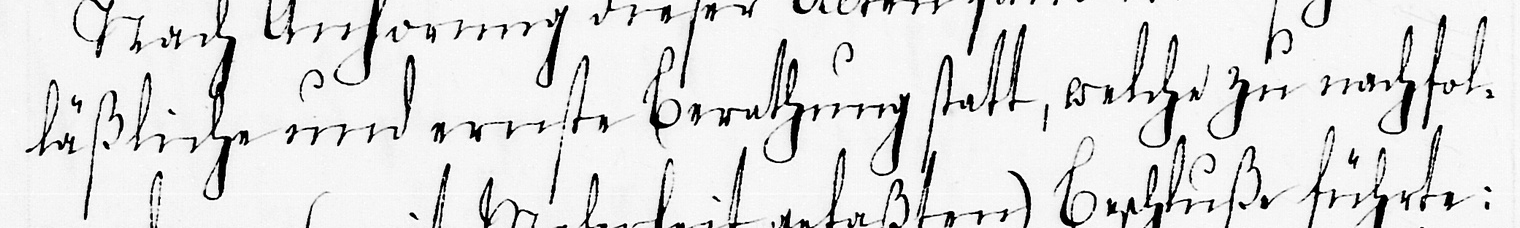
läßliche und ernste Berathung statt, welche zu nachfol¬
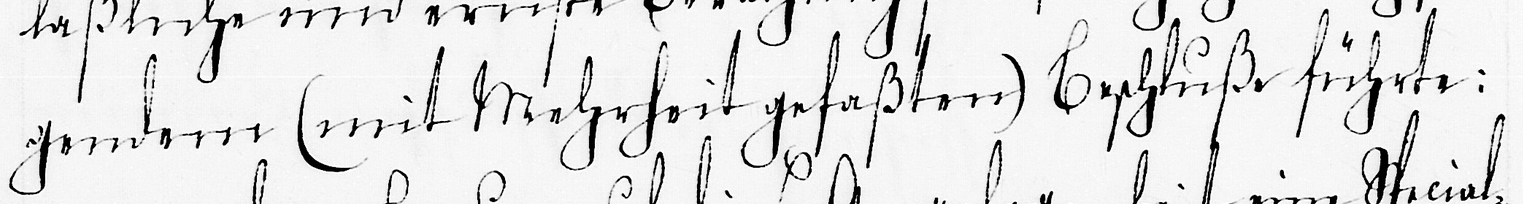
gendem (mit Mehrheit gefaßten) Beschluße führte:
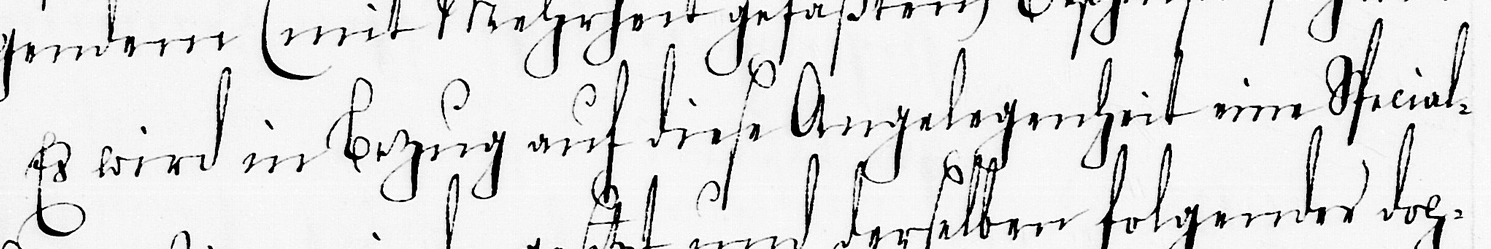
Es wird in Bezug auf diese Angelegenheit eine Specia¬
